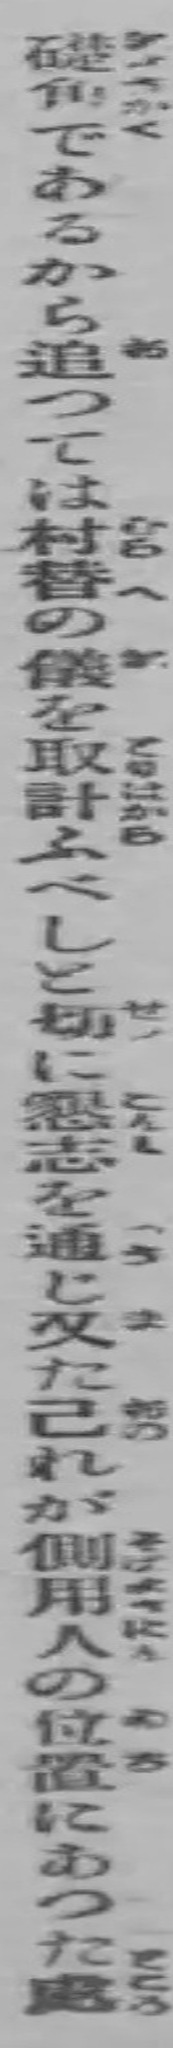礎角であるから追つては村替の儀を取計ふべしと切に懇志を通じ又た己れが側用人の位置にあつた処
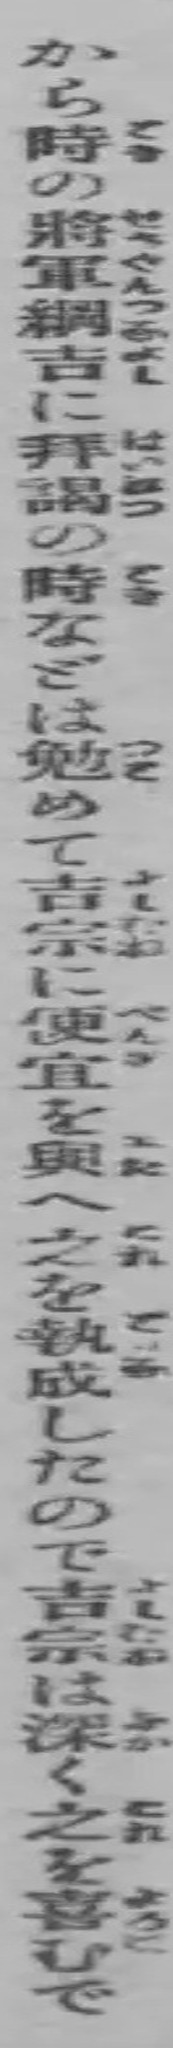から時の将軍綱吉に拝謁の時などは勉めて吉宗に便宜を与へ之を執成したので吉宗は深く之を喜むで
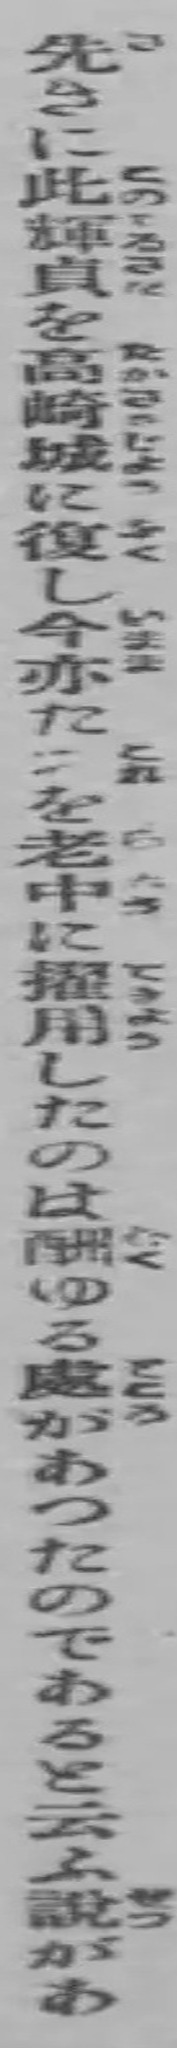先きに此輝貞を高崎城に復し今亦た之を老中に擁用したのは酬ゆる処があつたのであると云ふ説があ
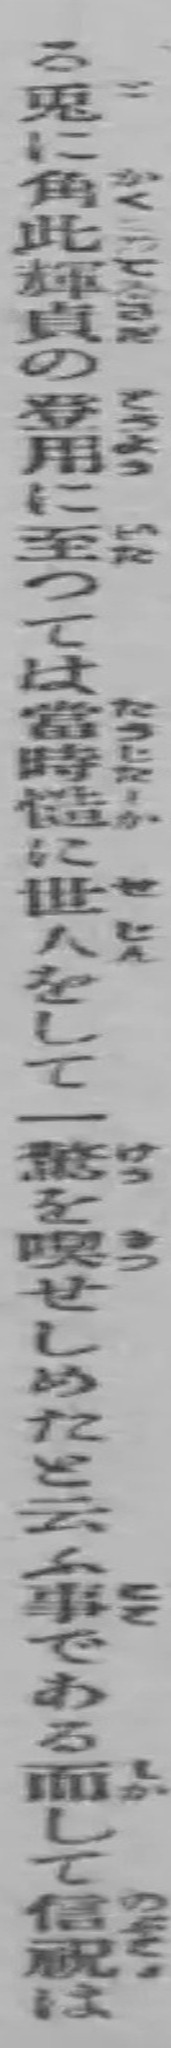る兎に角輝貞の登用に至つては当時慥に世人をして一驚を喫せしめたと云ふ事である而して信祝は
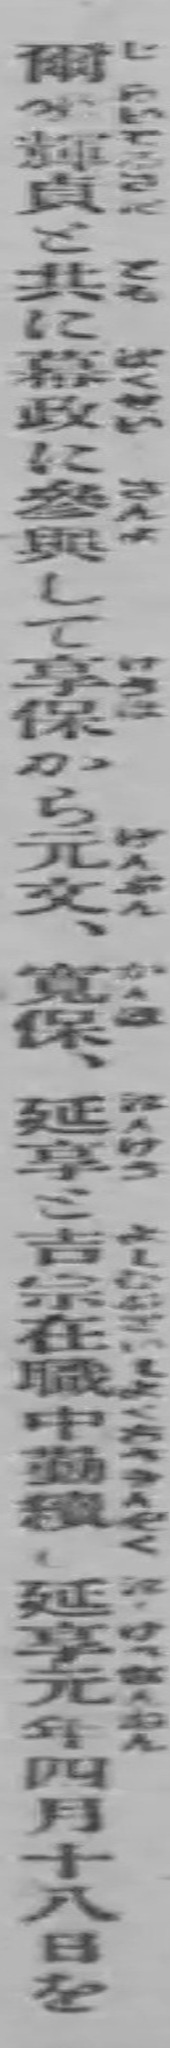爾来輝貞と共に幕政に参与して享保から元文、寛保、延享と吉宗在職中勤続し延享元年四月十八日を
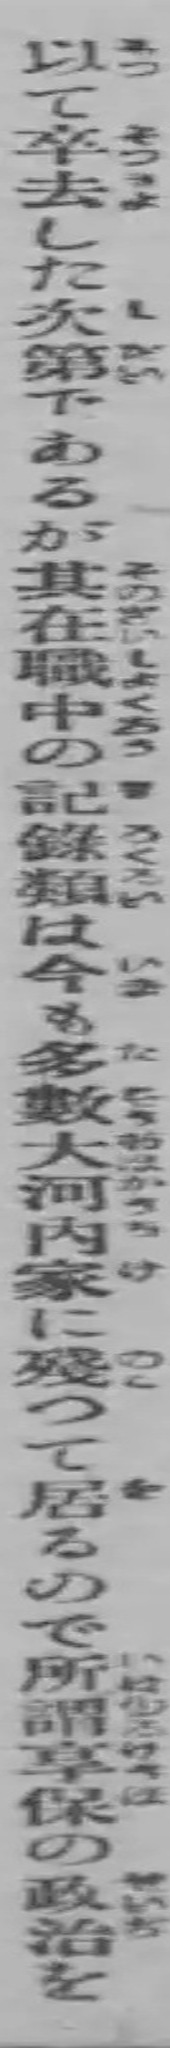以て卒去した次第であるが其在職中の記録類は今も多数大河内家に残つて居るので所謂享保の政治を
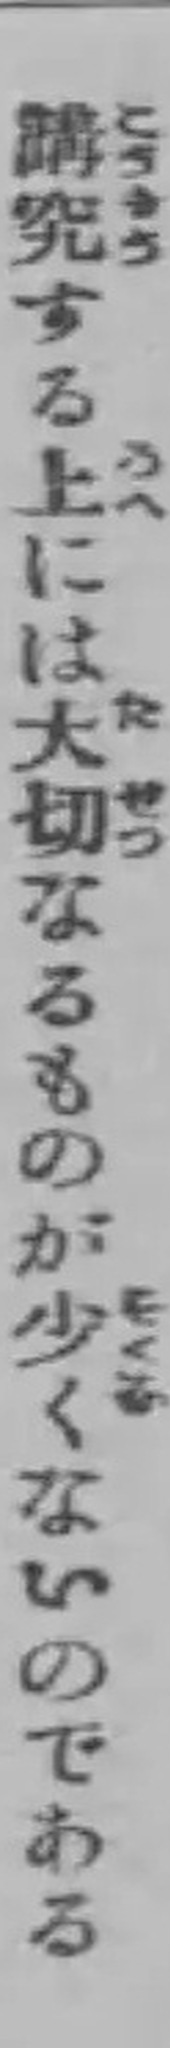講究する上には大切なるものが少くないのである
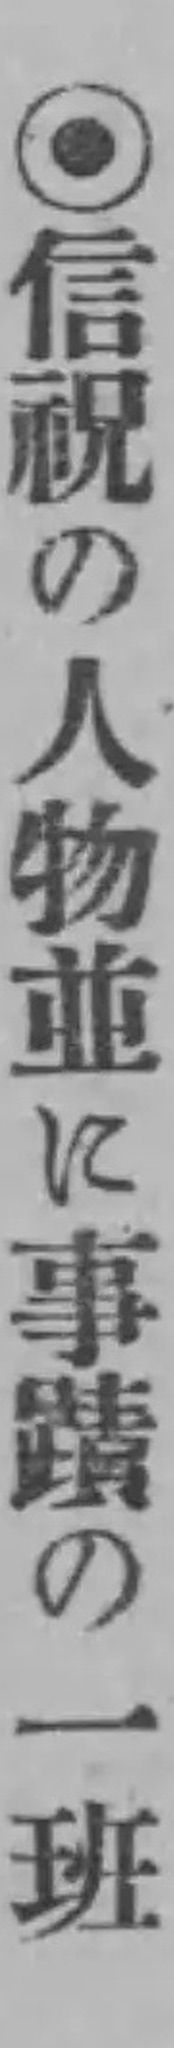⦿信祝の人物並に事蹟の一班
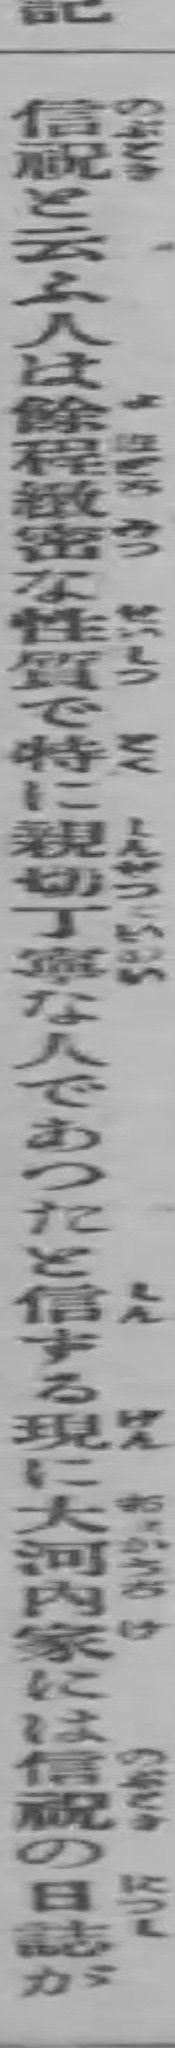信祝の日記信祝と云ふ人は余程緻密な性質で特に親切丁寧な人であつたと信ずる現に大河内家には信祝の日誌が

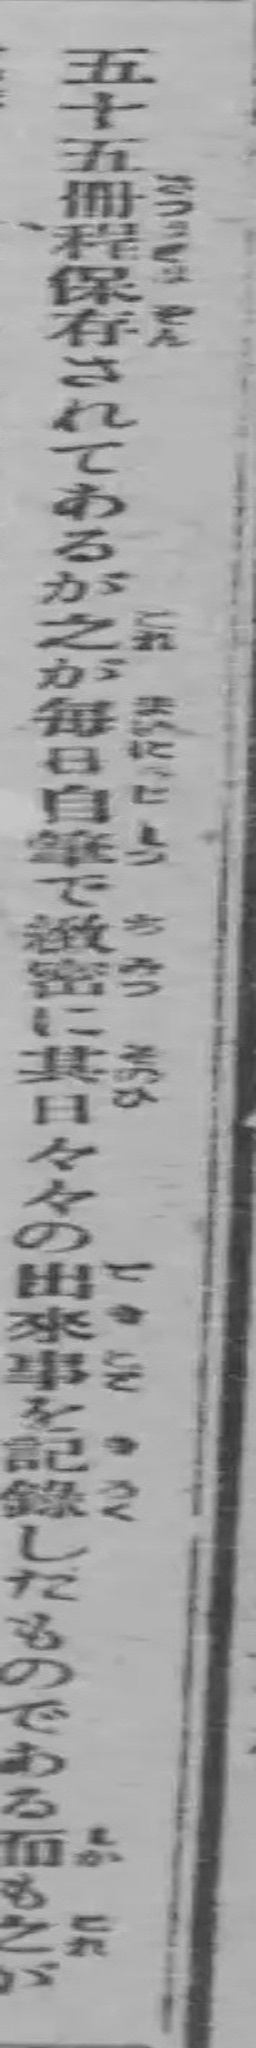五十五冊程保存されてあるが之が毎日自筆で緻密に其日々々の出来事を記録したものである而も之が
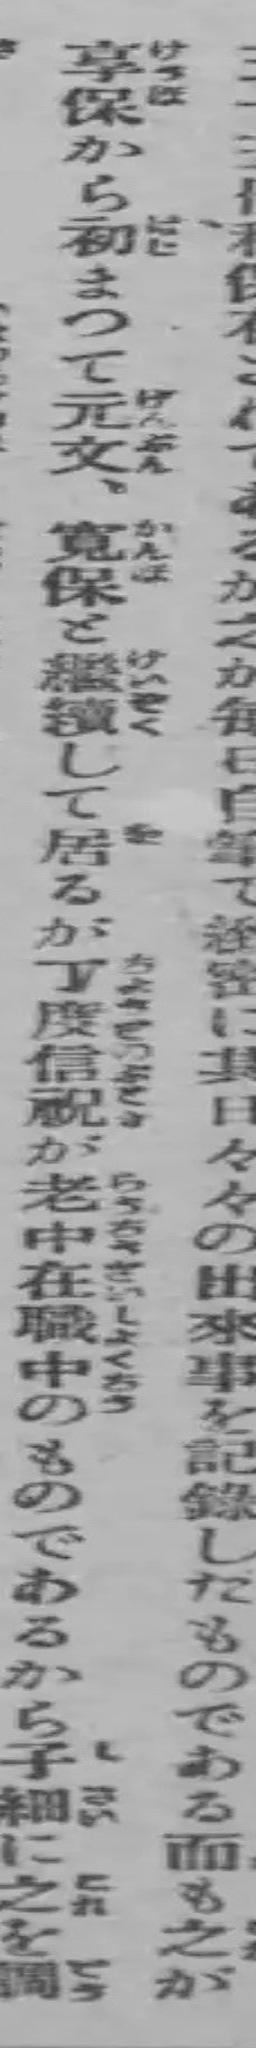享保から初まつて元文、寛保と継続して居るが丁度信祝が老中在職中のものであるから子細に之を調
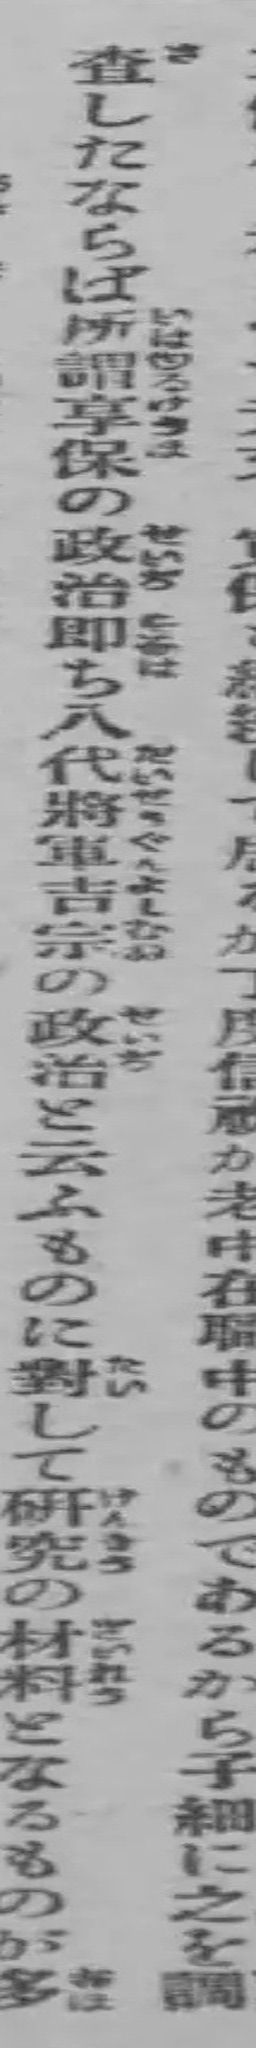査したならば所謂享保の政治即ち八代将軍吉宗の政治と云ふものに対して研究の材料となるものが多
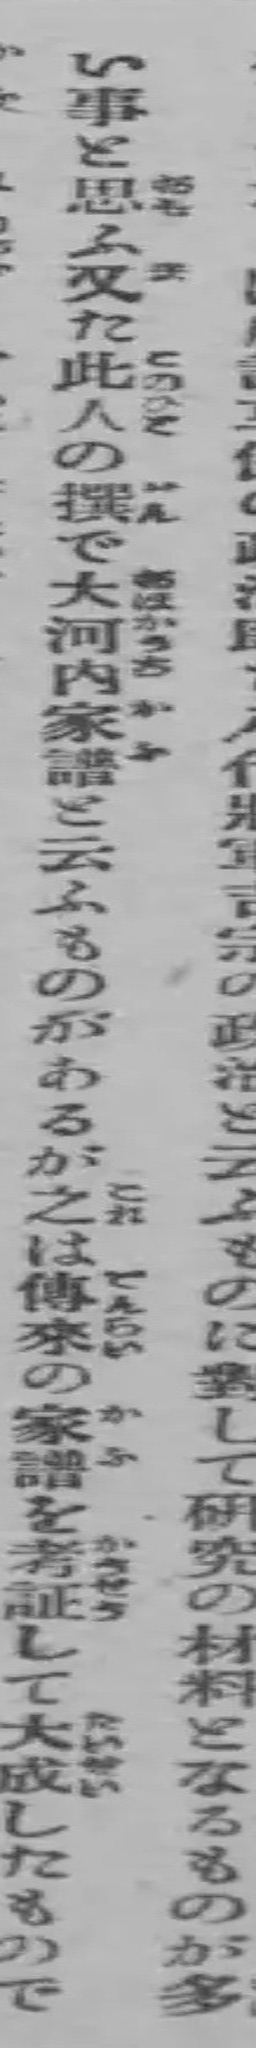大河内家譜い事と思ふ又た此人の撰で大河内家譜と云ふものがあるが之は伝来の家譜を考証して大成したもので
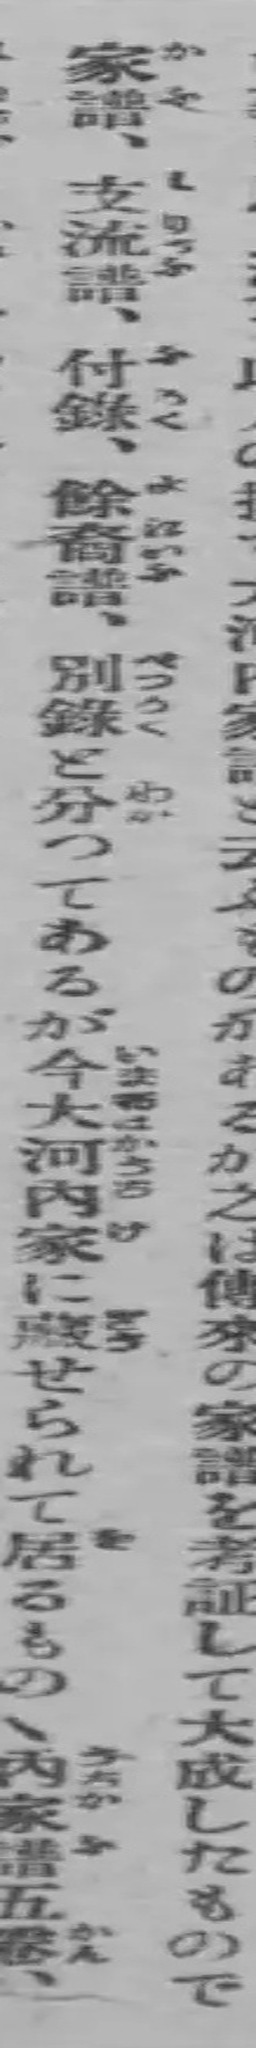家譜、支流譜、付録、余裔譜、別録と分つてあるが今大河内家に蔵せられて居るものゝ内家譜五巻、
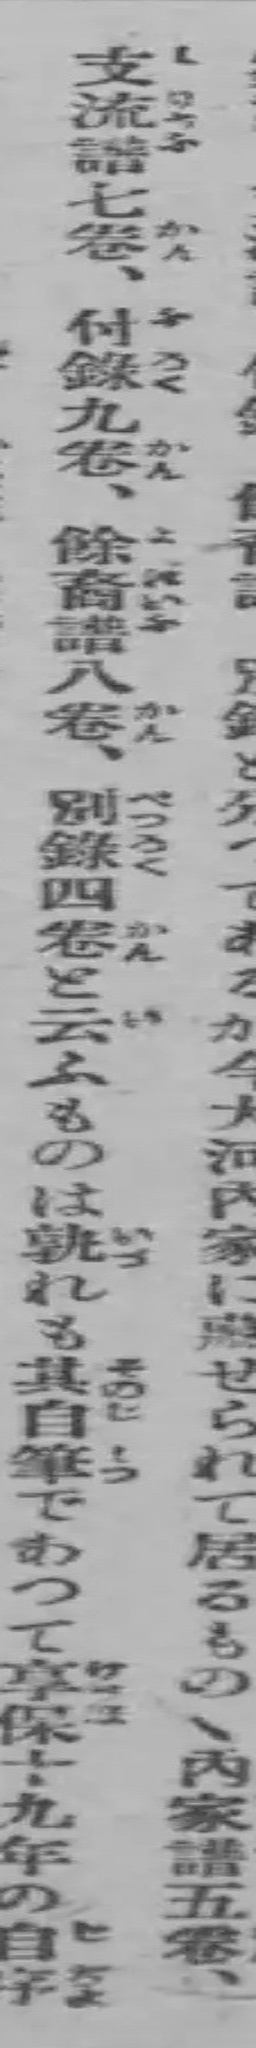支流譜七巻、付録九巻、余裔譜八巻、別録四巻と云ふものは孰れも其自筆であつて享保十九年の自序
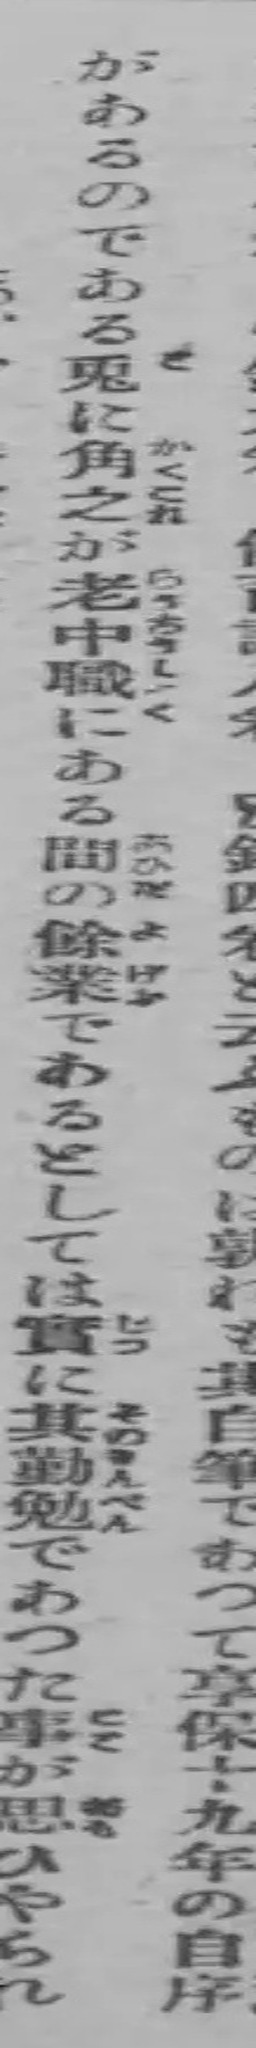があるのである兎に角之が老中職にある間の余業であるとしては実に其勤勉であつた事が思ひやられ
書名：豊橋市史談
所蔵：国立国会図書館 National Diet Library, JAPAN
